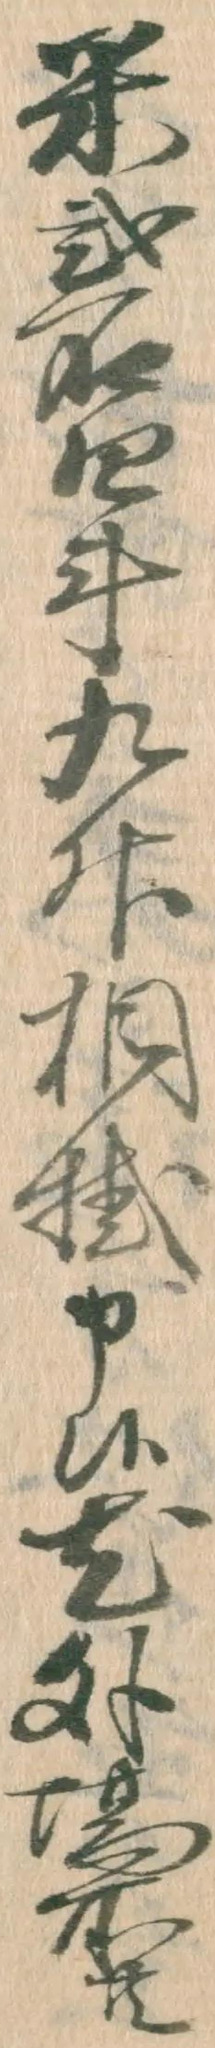米二石四斗九升相掛申候尤外場所共
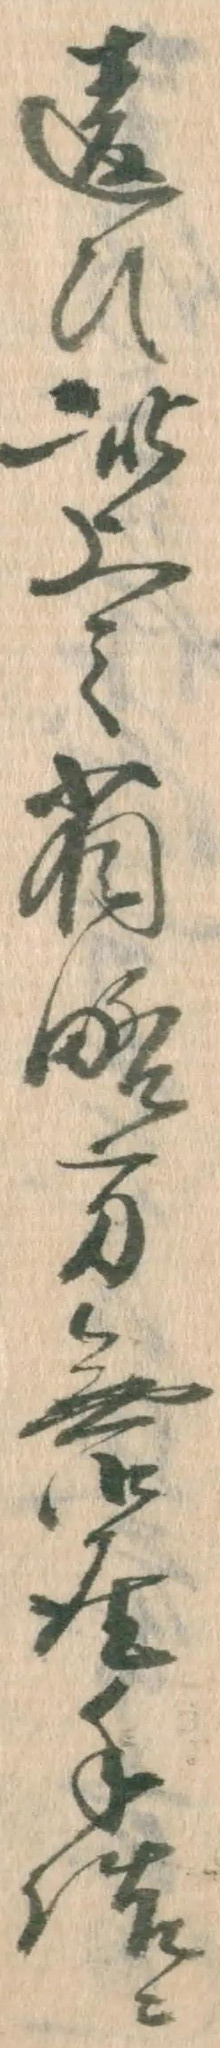違ひ此上之省略方無御座手詰ニ
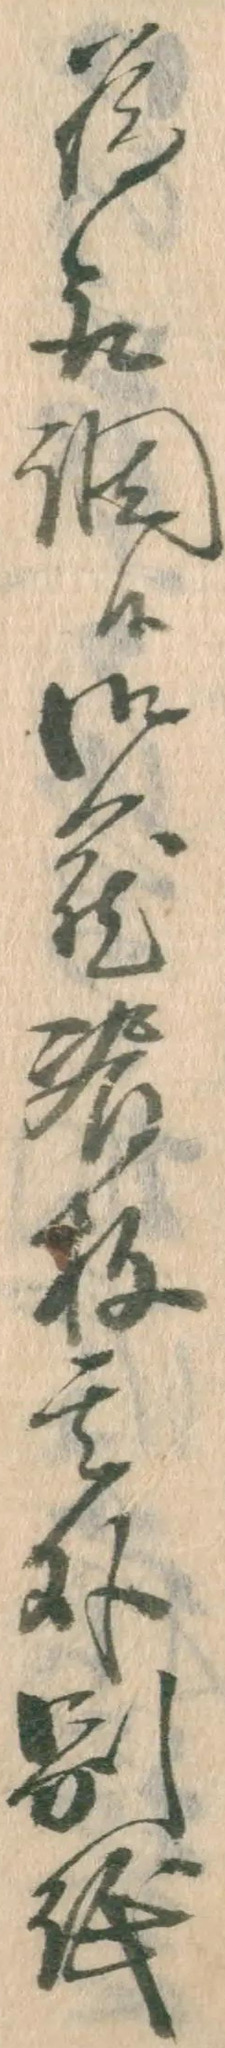為取調候御蔵替板其外別紙

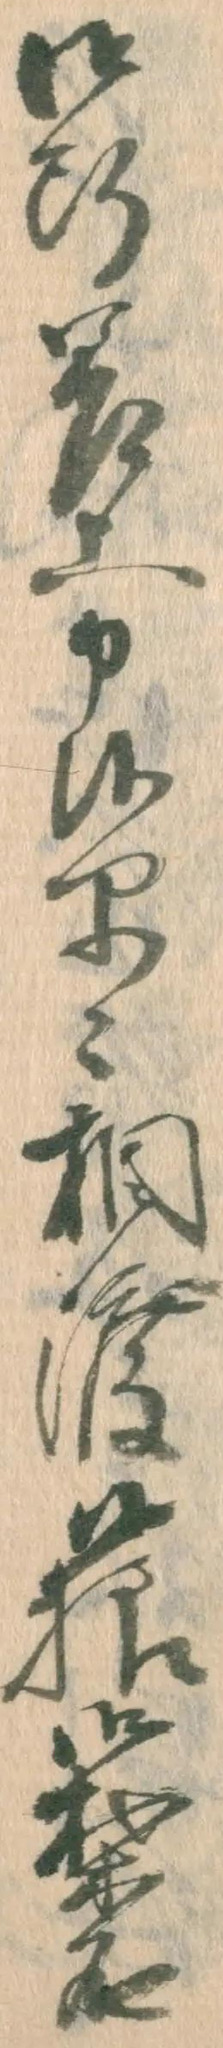御断差上申候早〻相渡候様御材木石
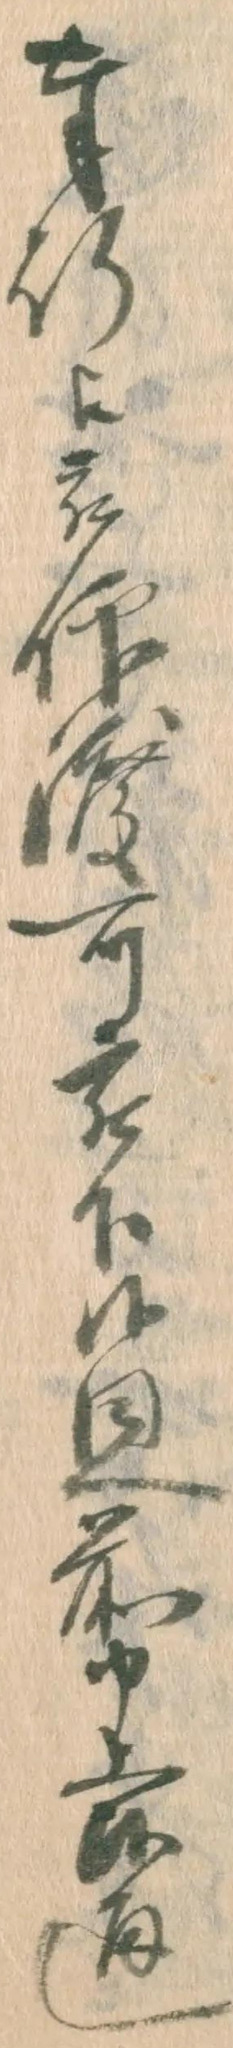奉行え被仰渡可被下候且前申上候通
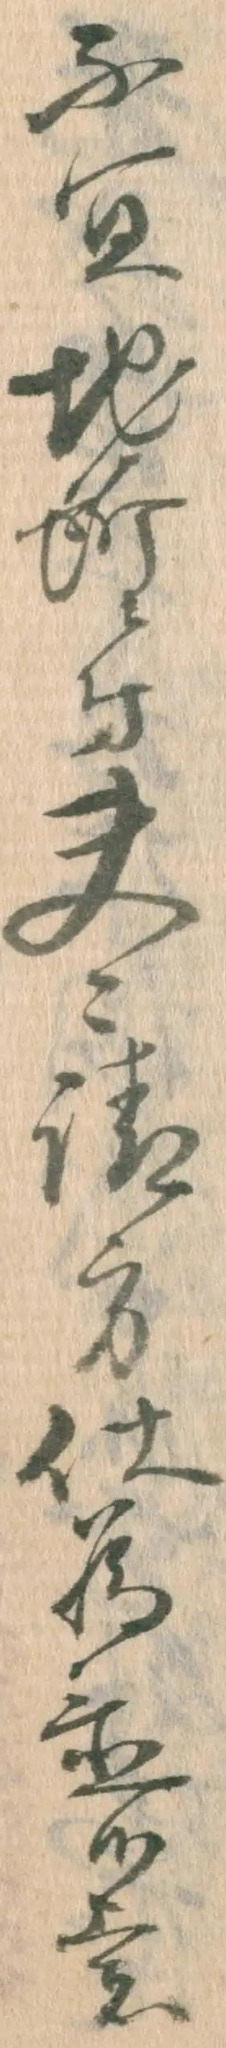不宜地所ニ付夫〻請方仕為置候上は
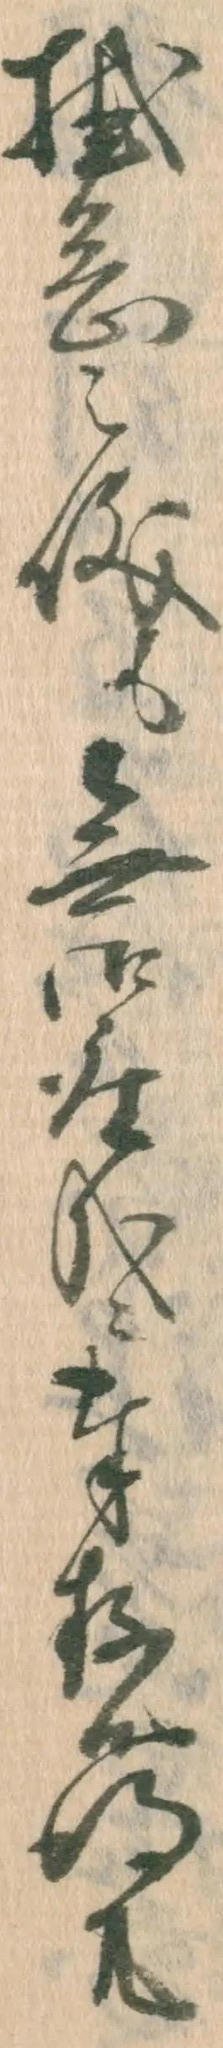掛念之儀も無御座哉ニ奉存候得共
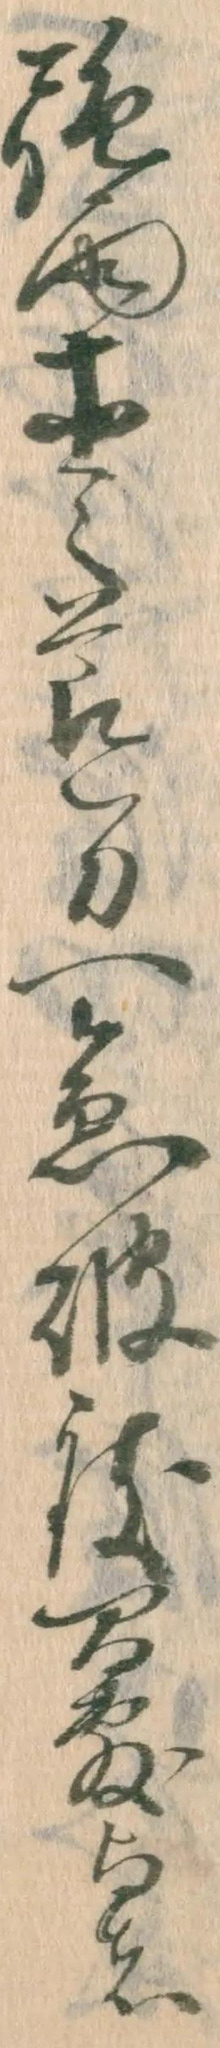強雨等之節万一急破致間敷とは
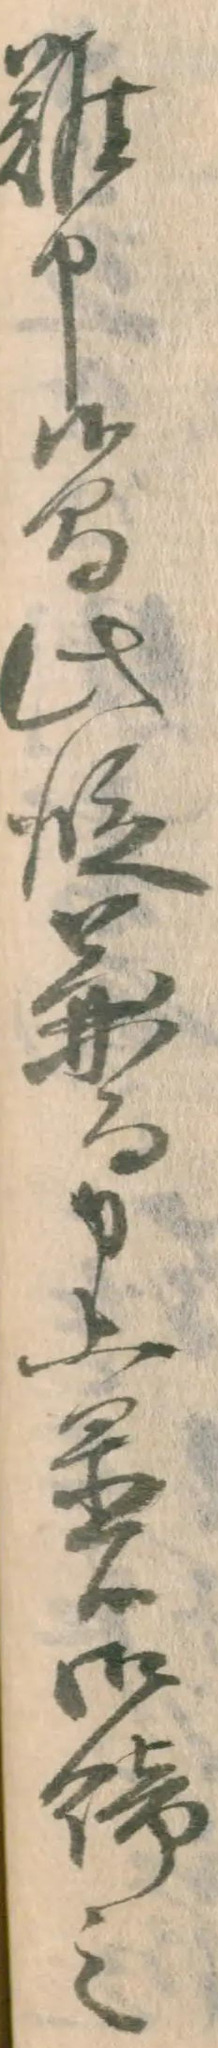難申候間此段兼て申上置候締之
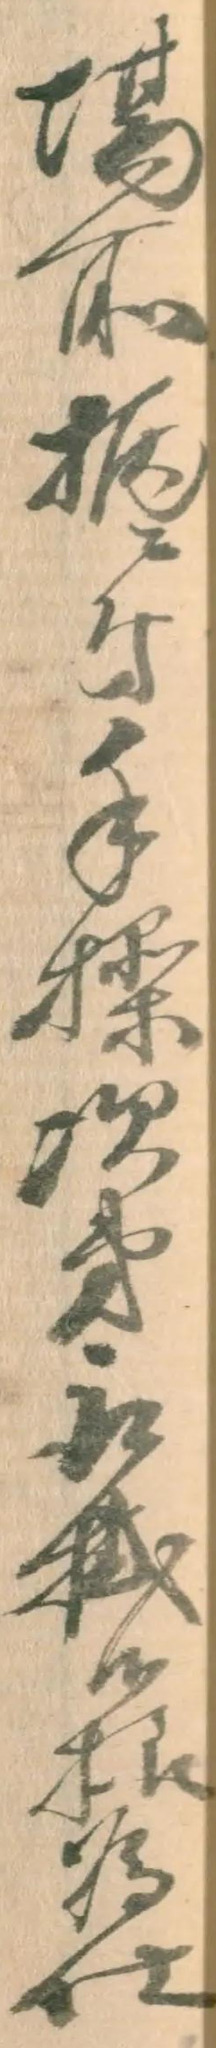場所柄ニ付手操次第取掛候様為仕
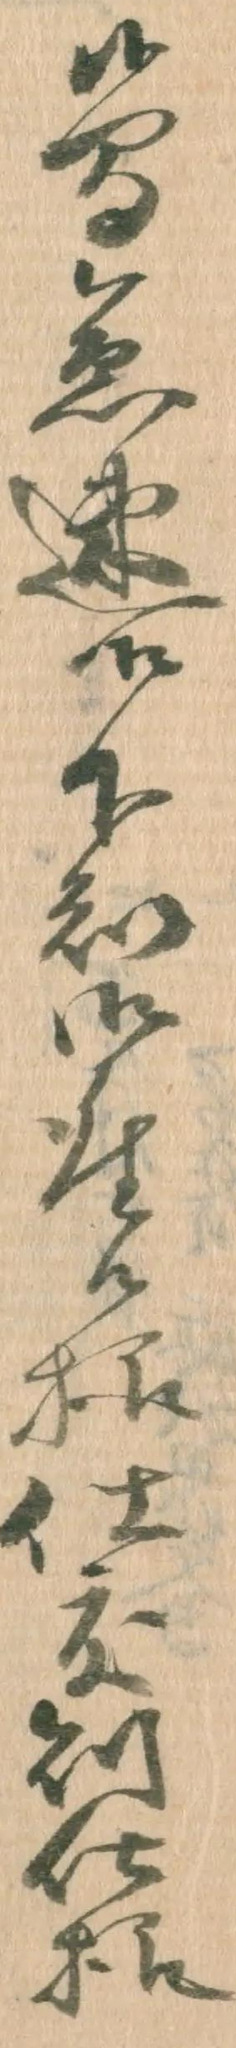候間急速御下知御座候様仕度則仕様
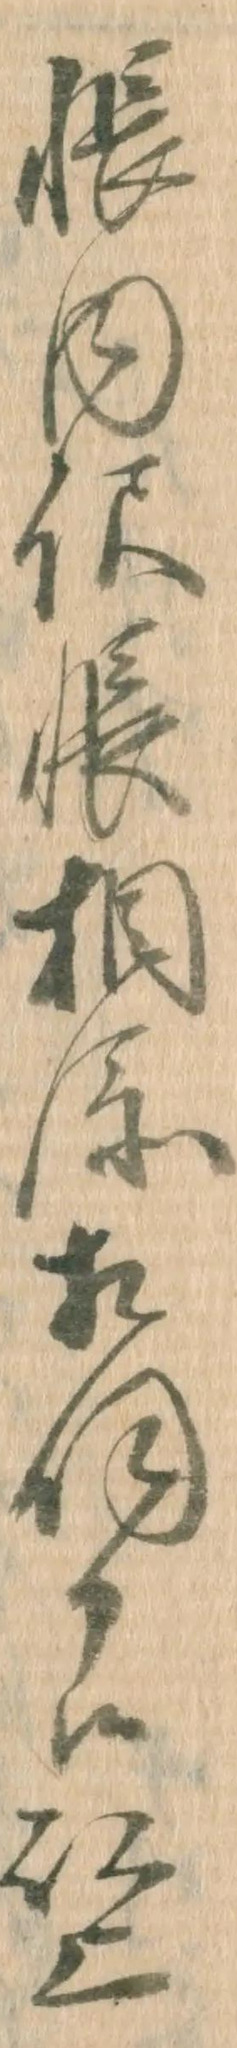帳内訳帳相添相伺申候以上
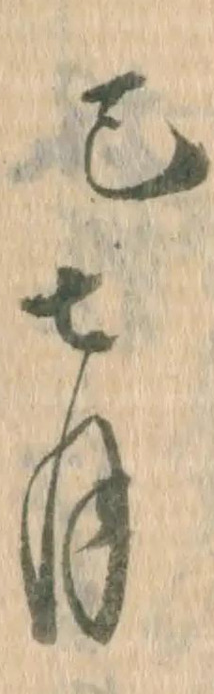巳七月

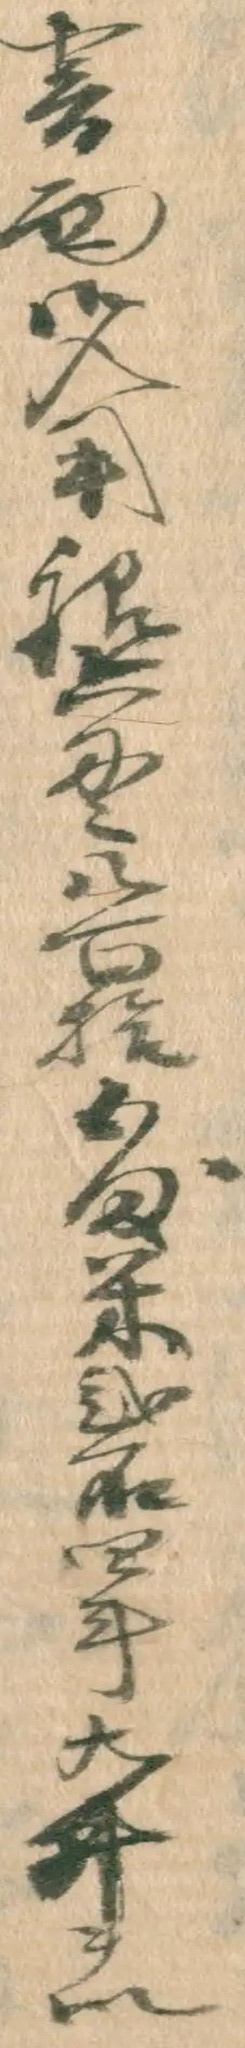┌書面御入用銀六貫八百拾五匁米弐石四斗九升ヲ以
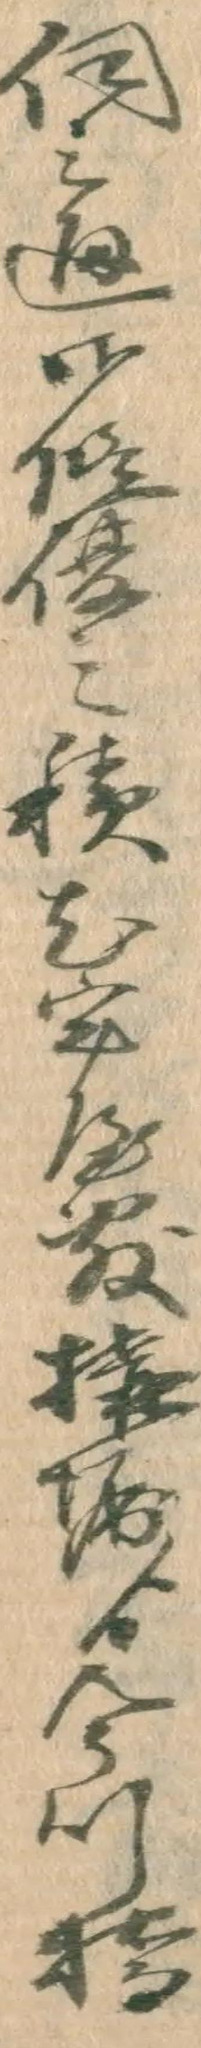│伺之通御修復之積尤牢屋敷構堀ゟ今川橋
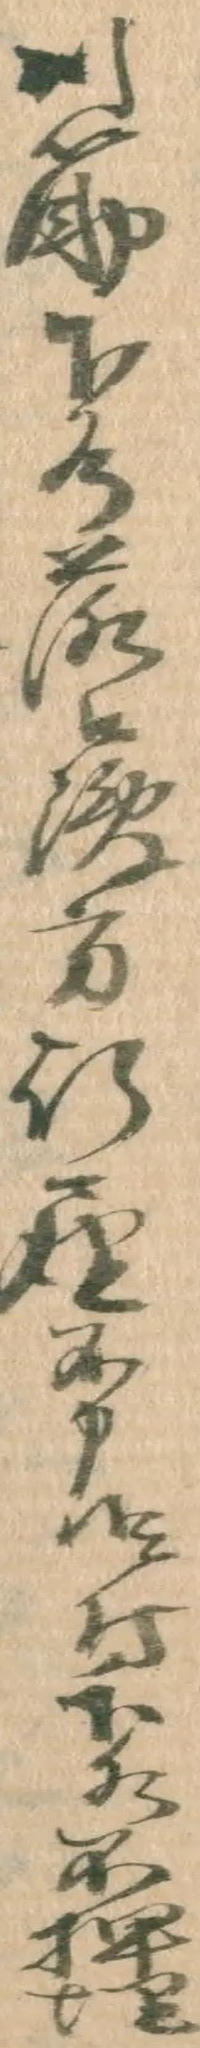│川筋下水落口浚方行届不申候ニ付下水不押埋
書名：七十冊物類集 71巻. [44] 四十三 牢屋敷御普請御修覆地震ニ付骨折候牢屋掛御褒美之部
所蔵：国立国会図書館 National Diet Library, JAPAN
